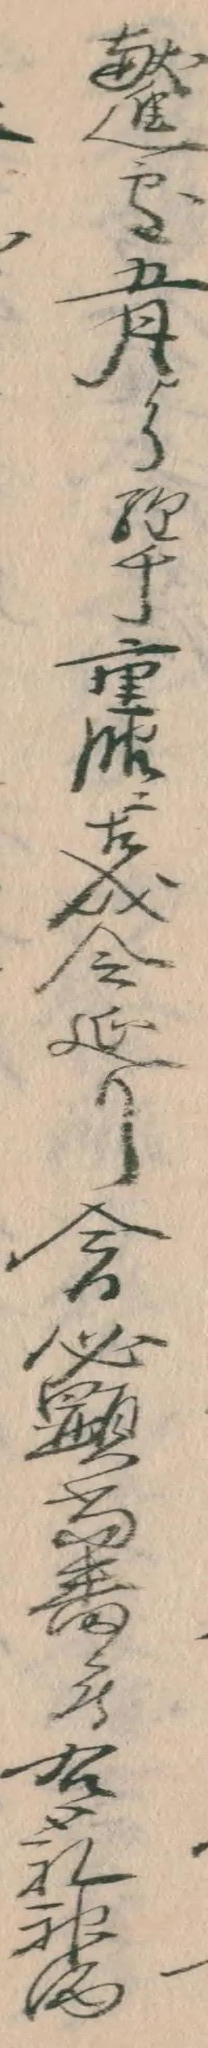献進處五月より経千重服ニ相成令延引今日必顕當番ニ付右御礼神酒
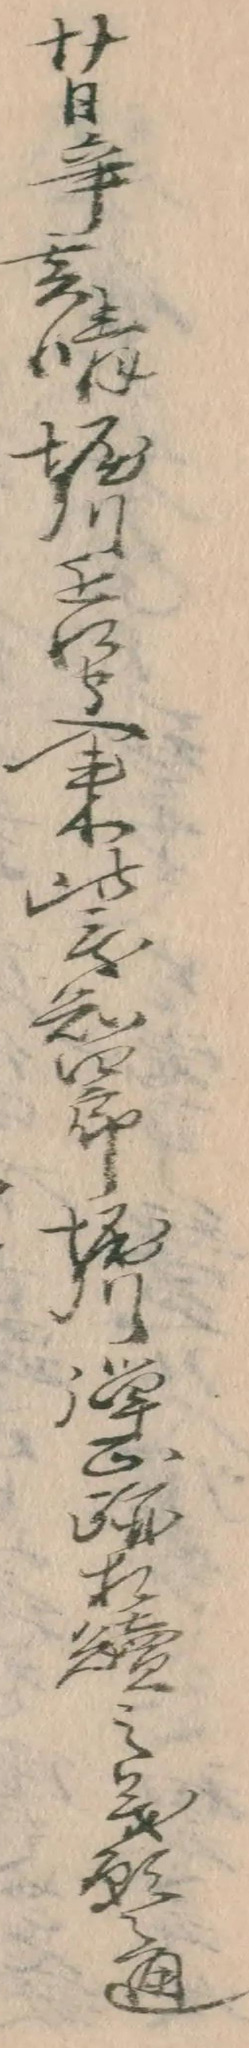廿日辛亥晴堀川近江守入来此度知四郎堀川弾正跡相續之義願之通
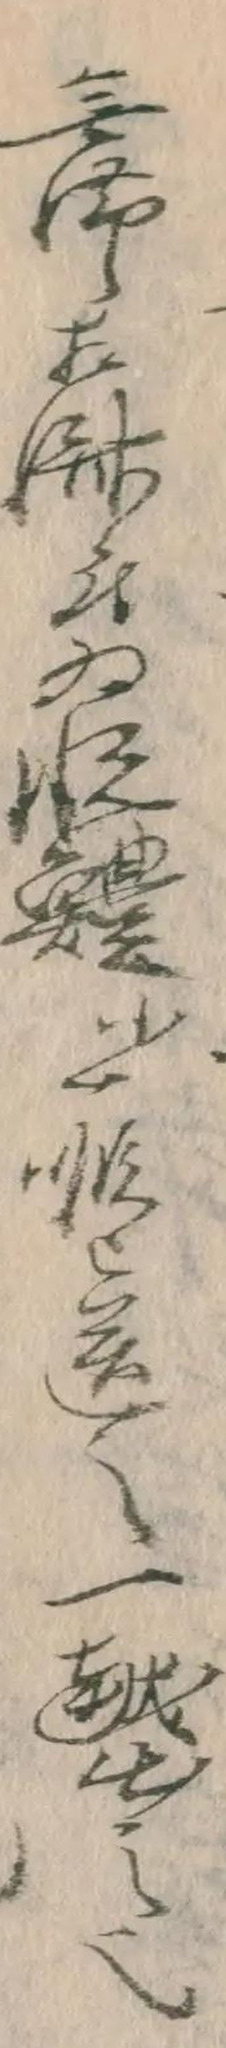無滞相済ニ付為祝禮云々順被送之一献出之也
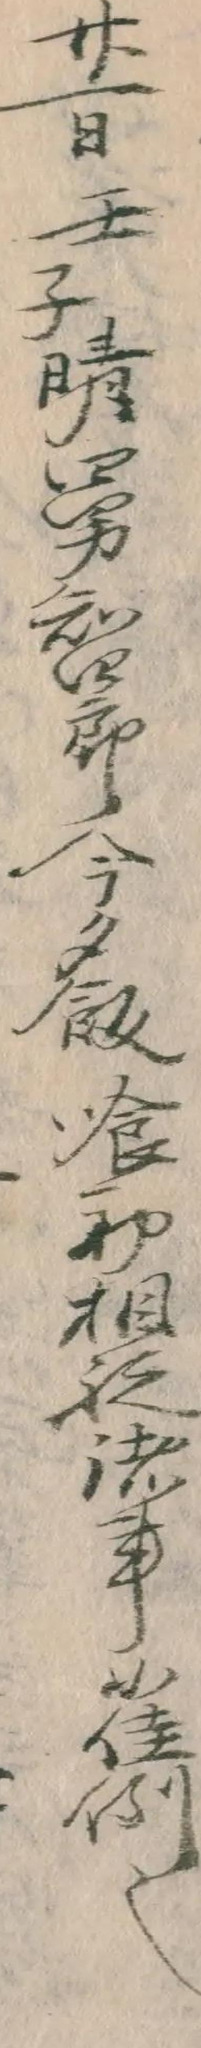廿一日壬子晴四男知四郎今夕飯喰初相祝諸事如佳例也
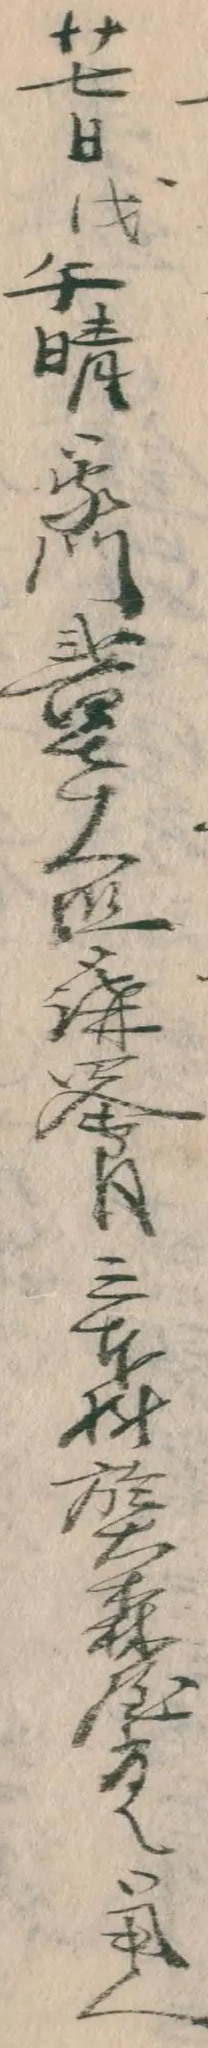廿七日戊午晴御家門弐百七十人組但講四會目三本樹於大森屋有之御用人
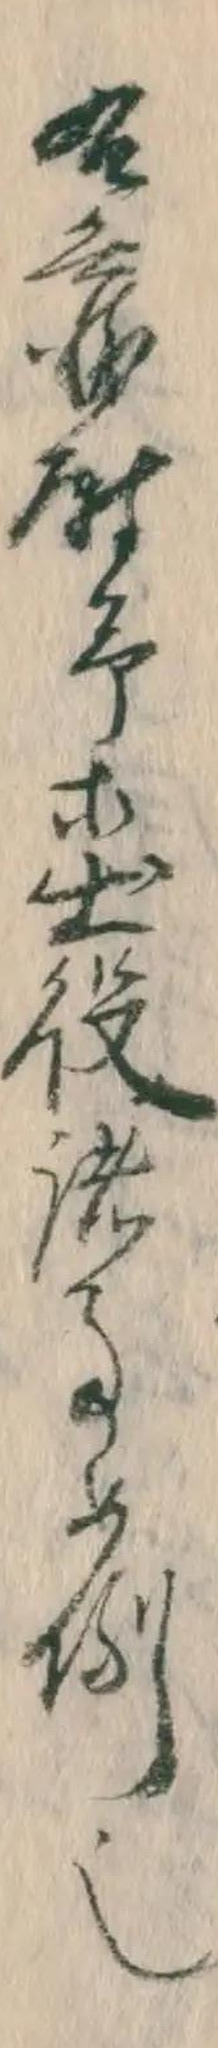右無場村予等出役諸事如例也
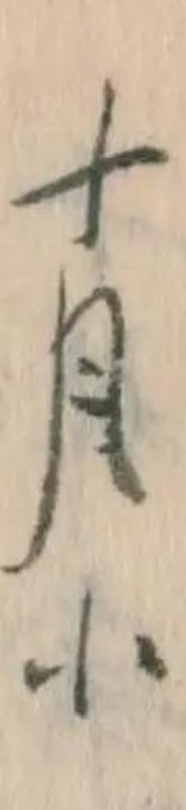十月小
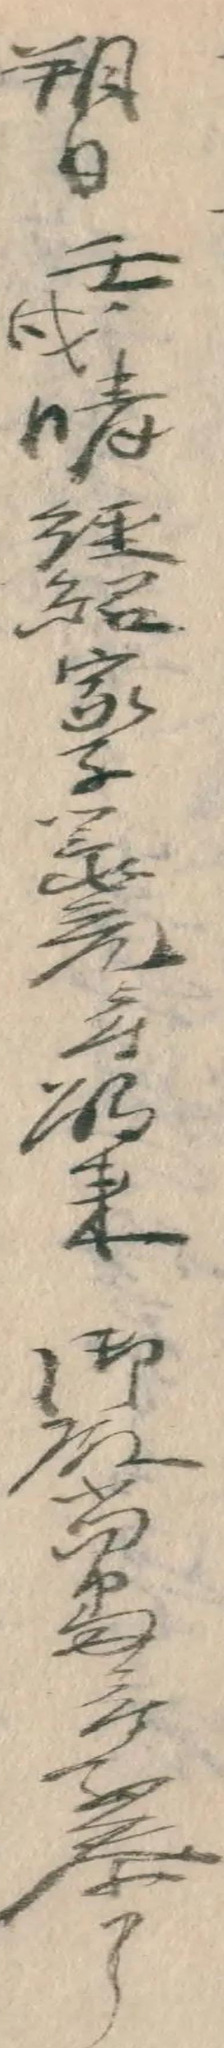朔日壬戌晴経招家子籤取ニ付触来御殿當番ニ付不参了
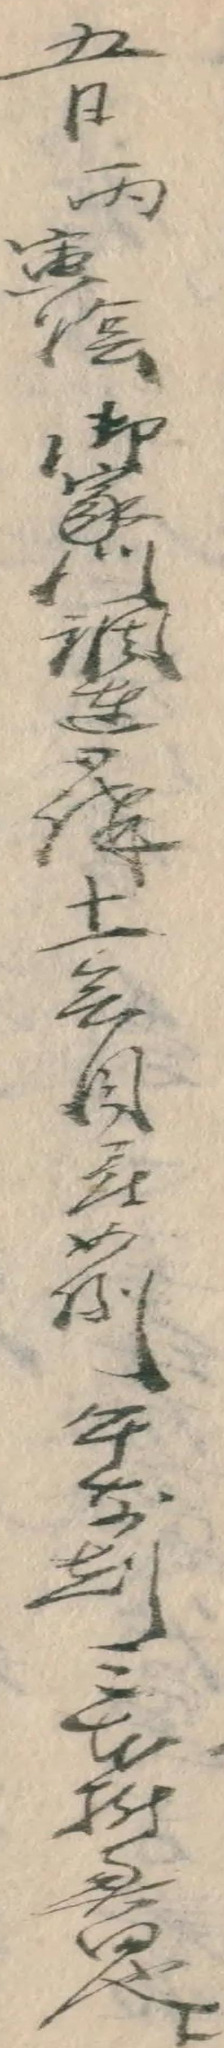五日丙寅陰御家門調達御講十一會目ニ付如例午前刻三本樹奥田屋
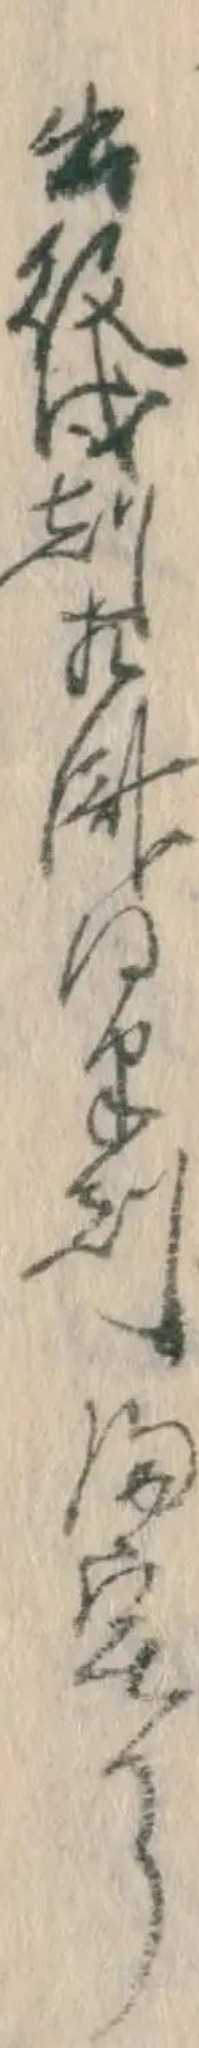出役戌刻相済同半刻帰宅了
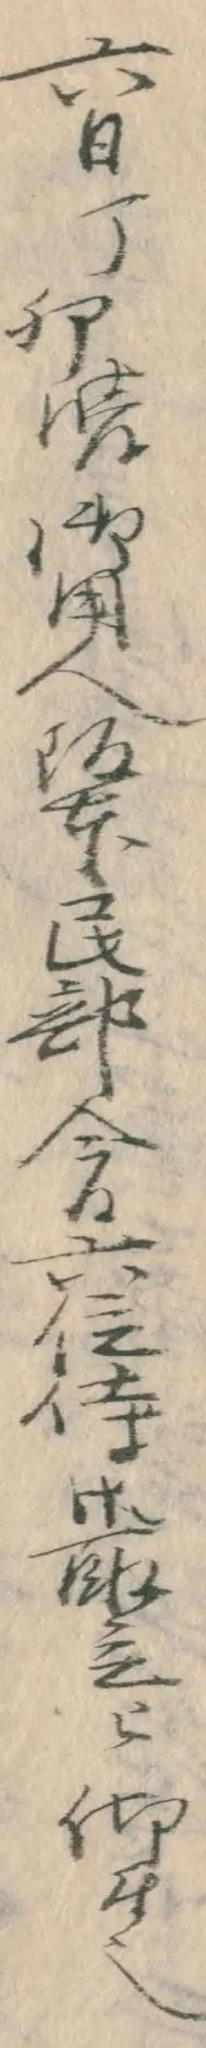六日丁卯晴御用人阪本民部今日六位侍御取立被仰付也
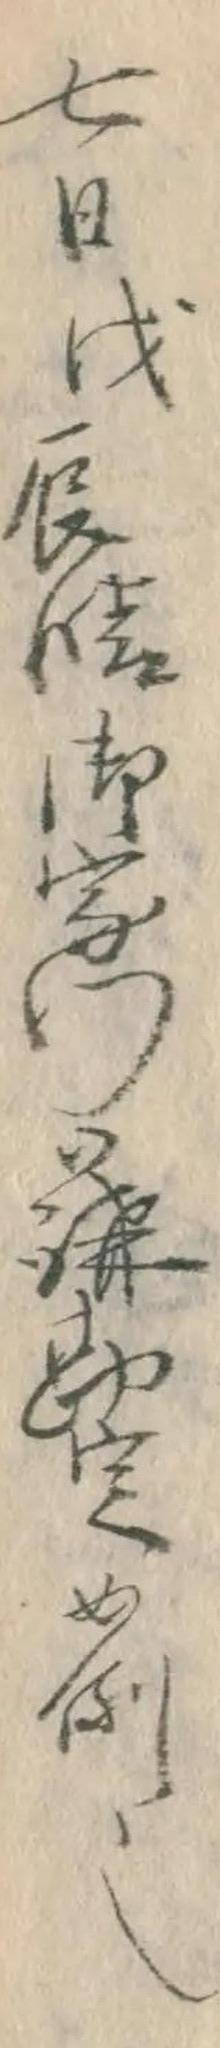七日戊辰晴御家門御講勘定如例也

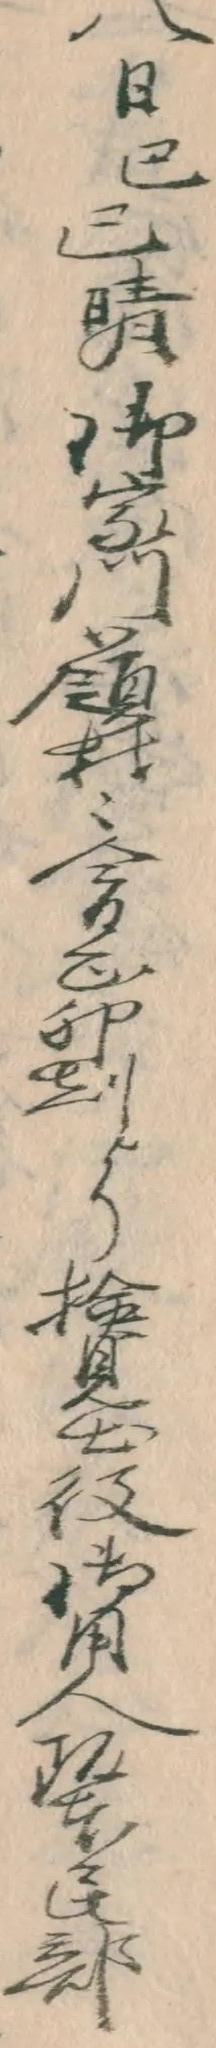八日己巳晴御家門御領村々今日卯刻より検見出役御用人坂本民部
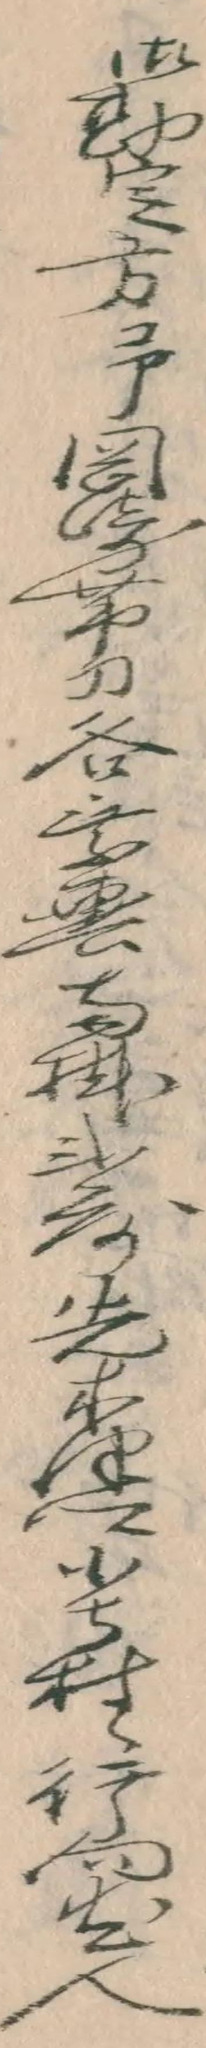御勘定方予岡崎帯刀各乗輿両掛弐荷先木津郷小寺村へ行向出人
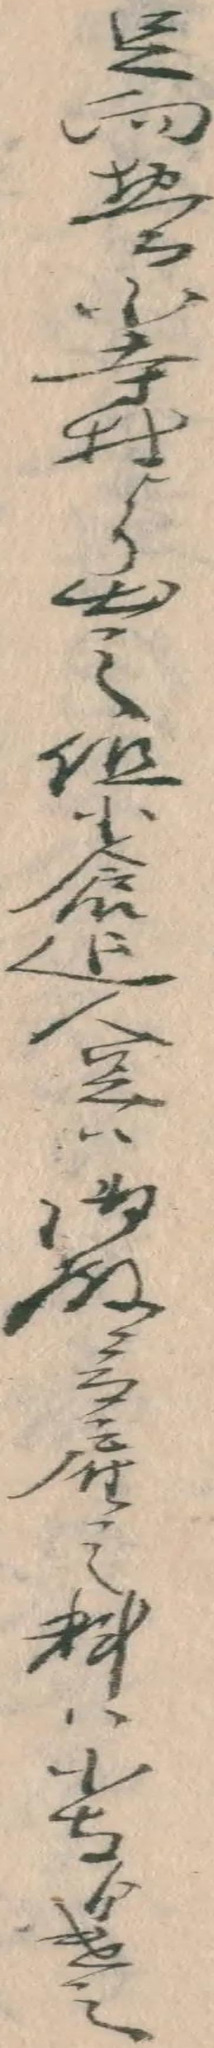足向惣而小寺村より出也但小倉迄人足ハ御殿二而雇之料ハ小寺ゟ遣之
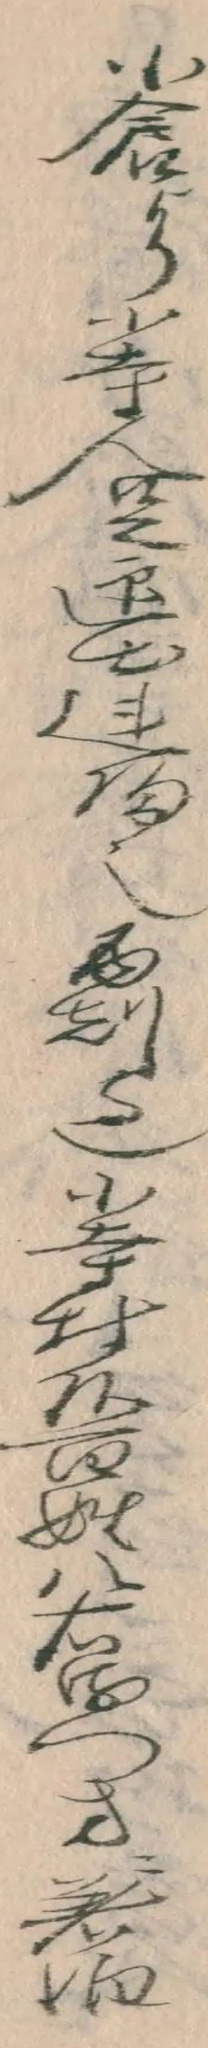小倉より小寺人足退出連帰也酉刻過小寺村頭百姓八右衛門方ニ着泊
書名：賀茂社記録. 第65冊
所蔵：国立国会図書館 National Diet Library, JAPAN
